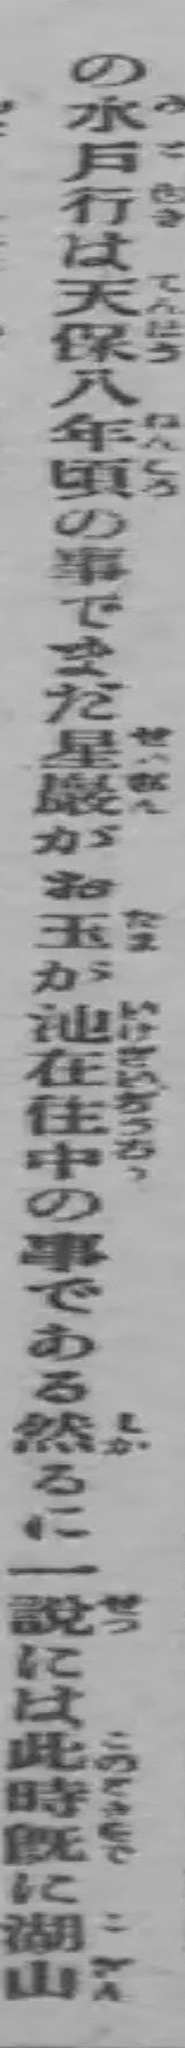の水戸行は天保八年頃の事でまだ星嚴がお玉が池在住中の事である然るに一説には此時既に湖山
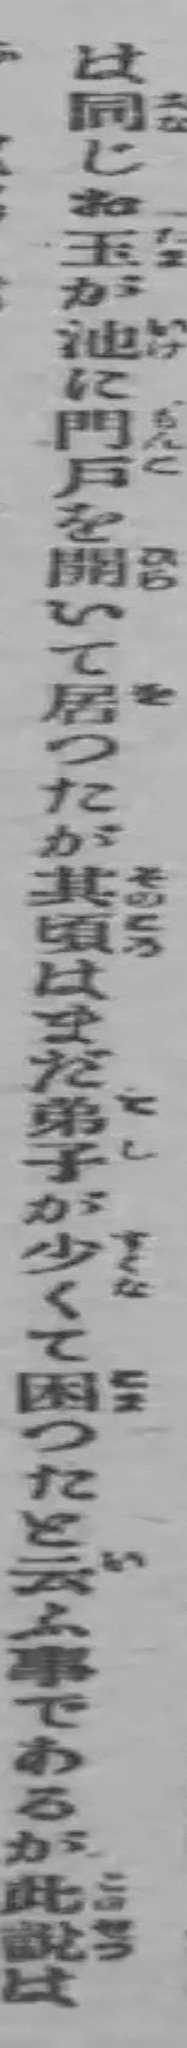は同じお玉が池に門戸を開いて居つたが其頃はまだ弟子が少くて困つたと云ふ事であるが此説は
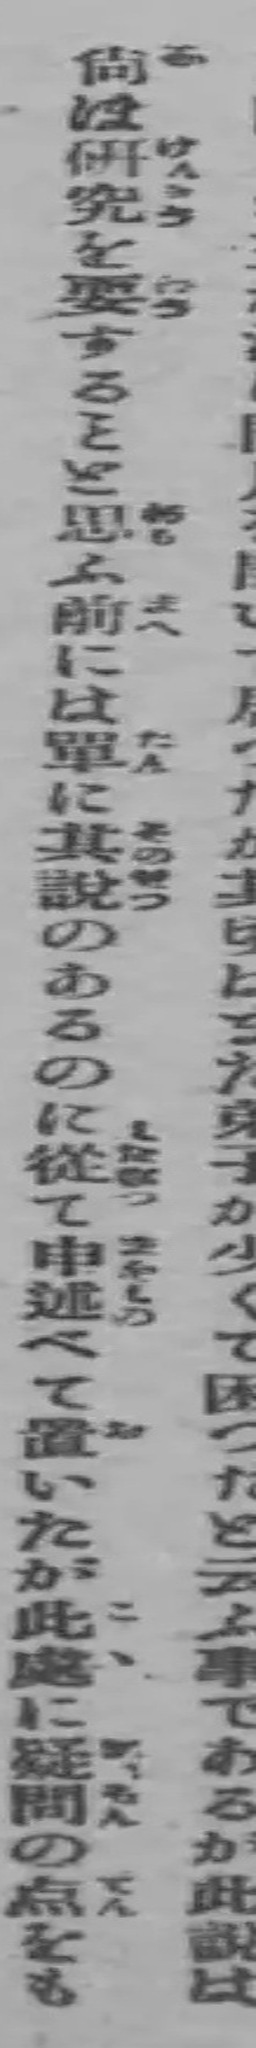尚ほ研究を要することと思ふ前には単に其説のあるのに従て申述べて置いたが此処に疑問の点をも
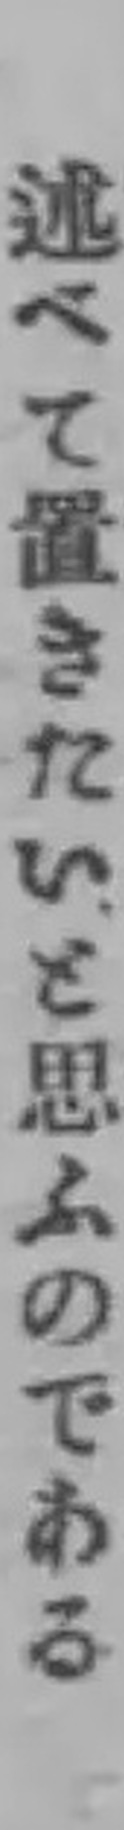述べて置きたいと思ふのである
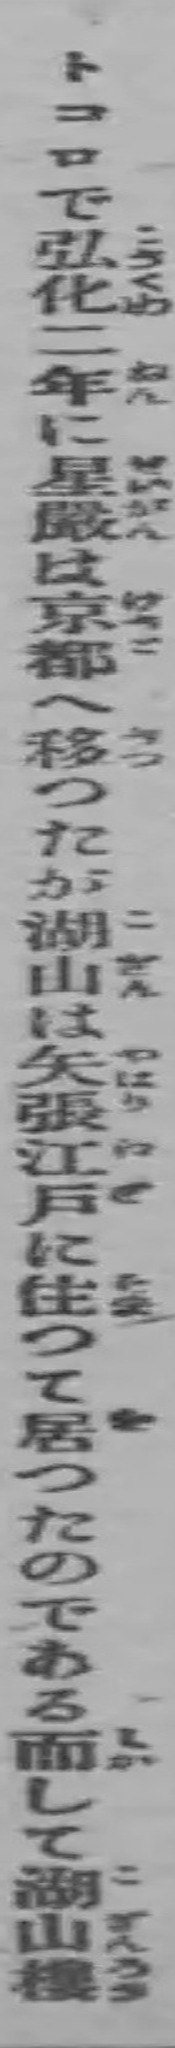トコロで弘化二年に星嚴は京都へ移つたが湖山は矢張江戸に住つて居つたのである而して湖山楼
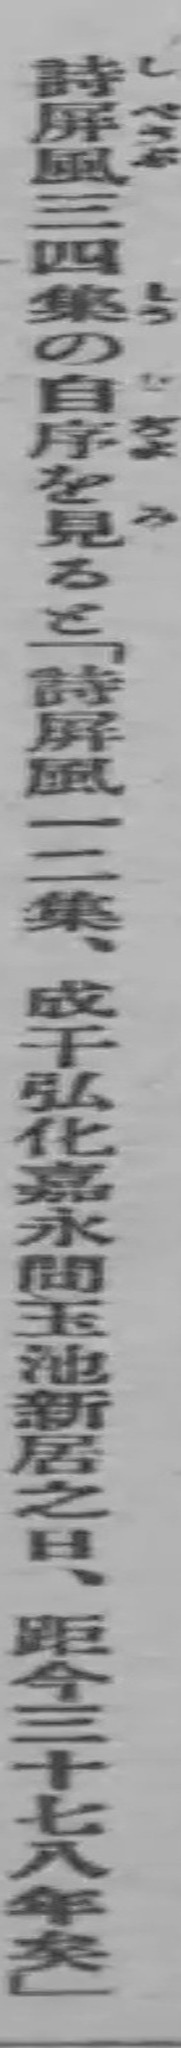詩屏風三四集の自序を見ると「詩屏風一二集、成干弘化嘉永間玉池新居之日、距今三十七八年矣」
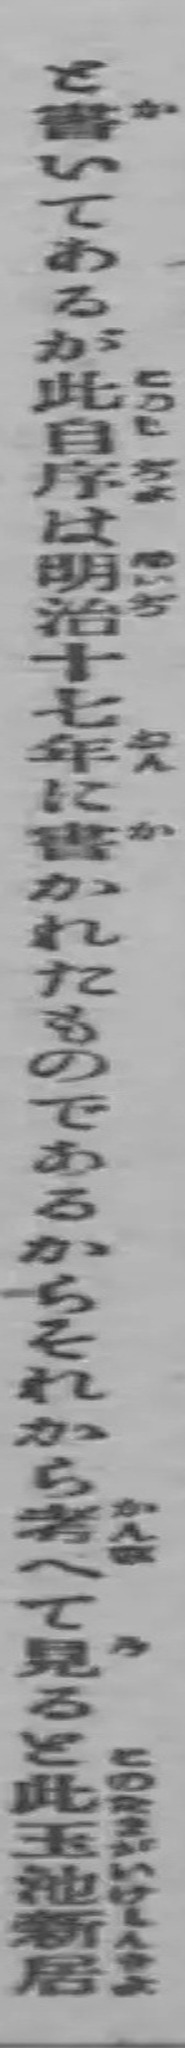と書いてあるが此自序は明治十七年に書かれたものであるからそれから考へて見ると此玉池新居
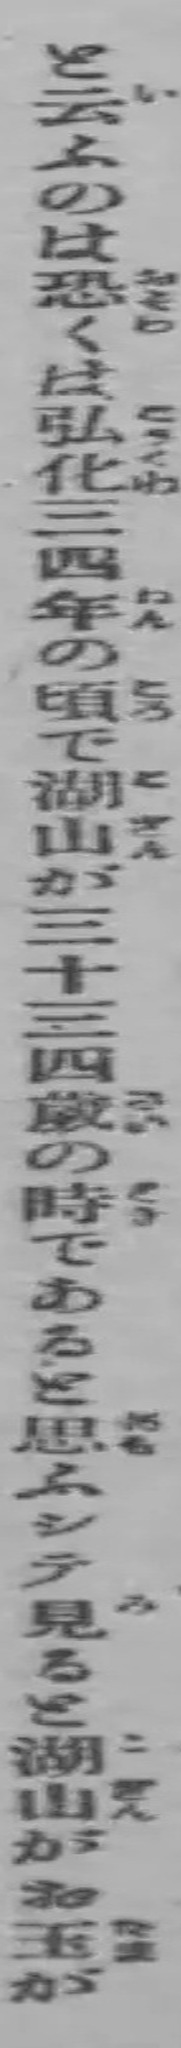と云ふのは恐くは弘化三四年の頃で湖山が三十三四歳の時であると思ふシテ見ると湖山がお玉が
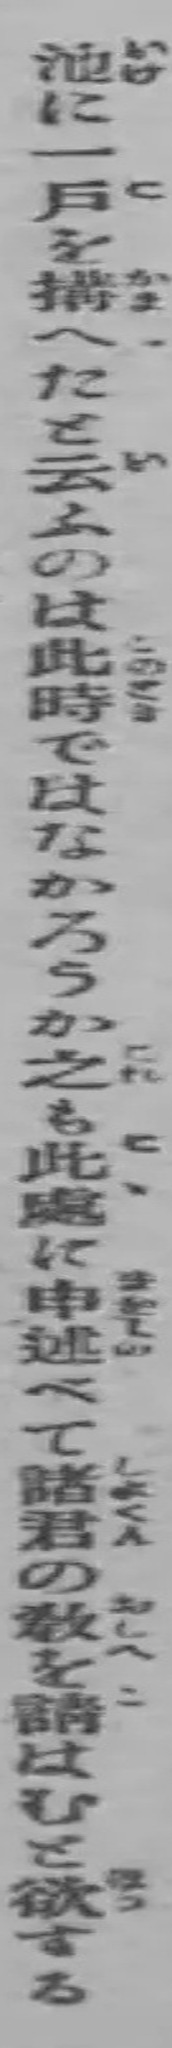池に一戸を構へたと云ふのは此時ではなかろうか之も此処に申述べて諸君の教を請はむと欲する
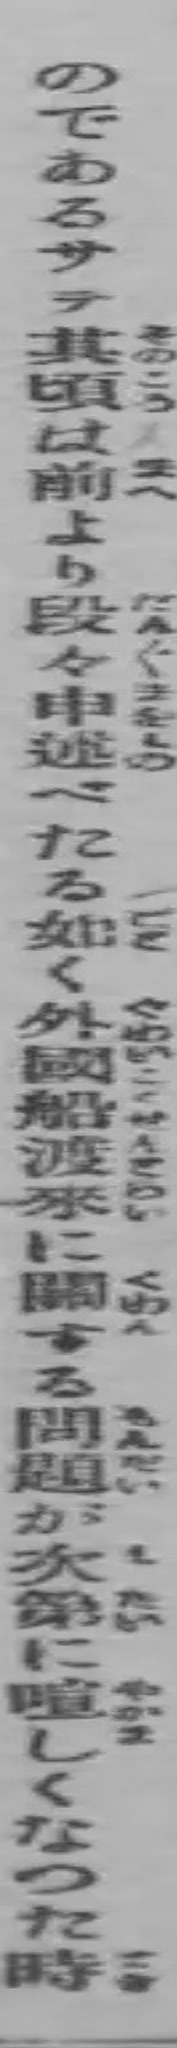のであるサテ其頃は前より段々申述べたる如く外国船渡来に関する問題が次第に喧しくなつた時
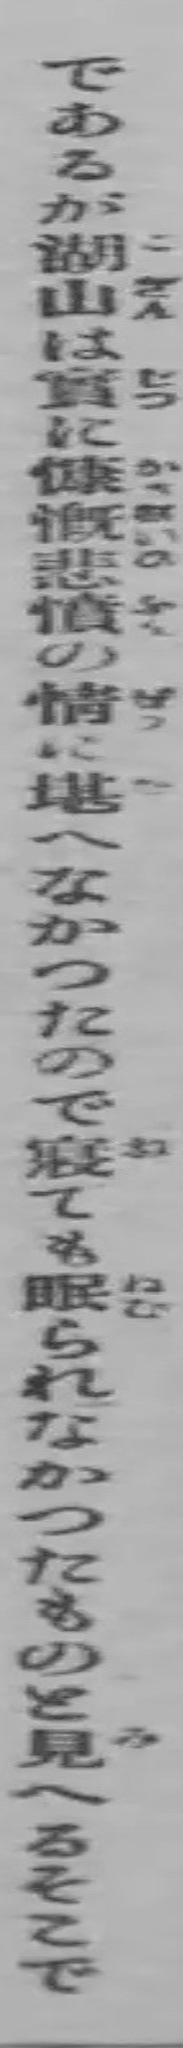であるが湖山は実に慷慨悲憤の情に堪へなかつたので寝ても眠られなかつたものと見へるそこで
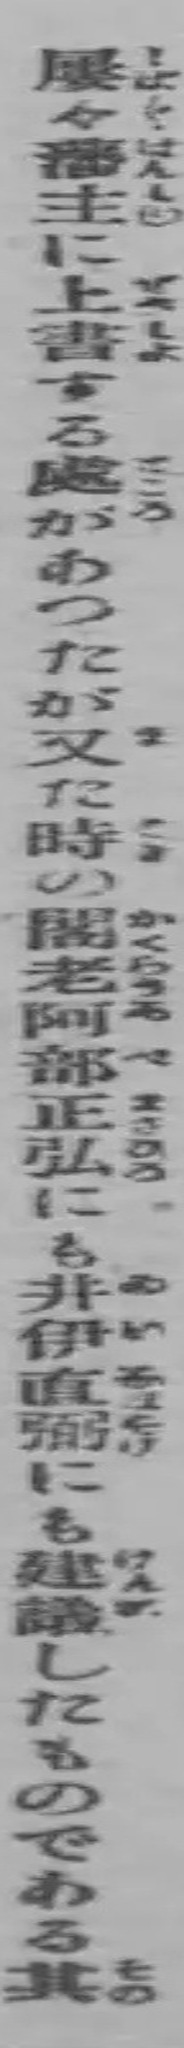屡々藩主に上書する処があつたが又た時の閣老阿部正弘にも井伊直弼にも建議したものである其
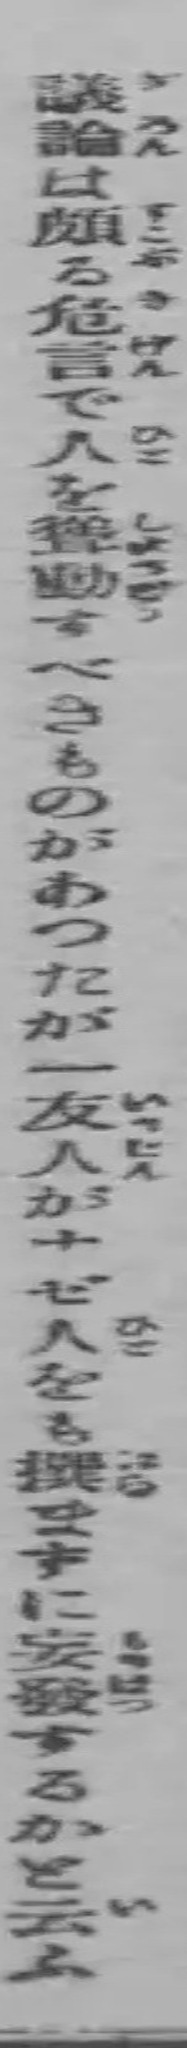議論は頗る危言で人を聳動すべきものがあつたが一友人がナゼ人をも撰まずに妾発するかと云ふ
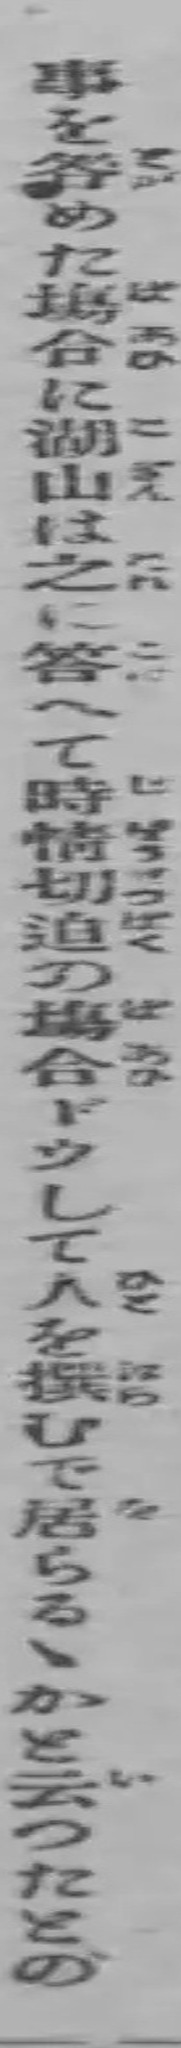事を咎めた場合に湖山は之に答へて時情切迫の場合ドウして人を撰むで居らるゝかと云つたとの
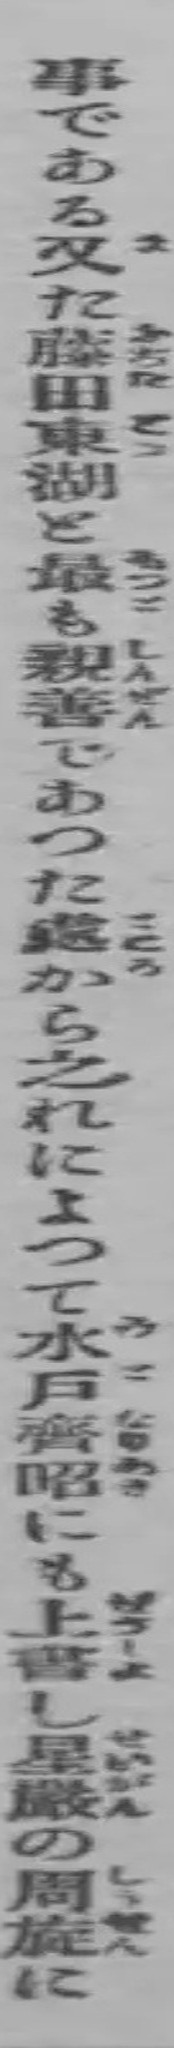事である又た藤田東湖と最も親善であつた処から之れによつて水戸斉昭にも上書し星嚴の周旋に
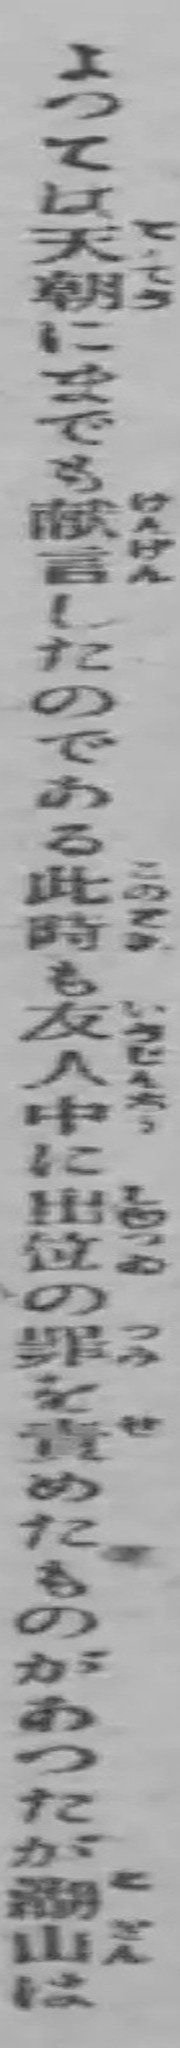よつては天朝にまでも献言したのである此時も友人中に出位の罪を責めたものがあつたが湖山は
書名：豊橋市史談
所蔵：国立国会図書館 National Diet Library, JAPAN
